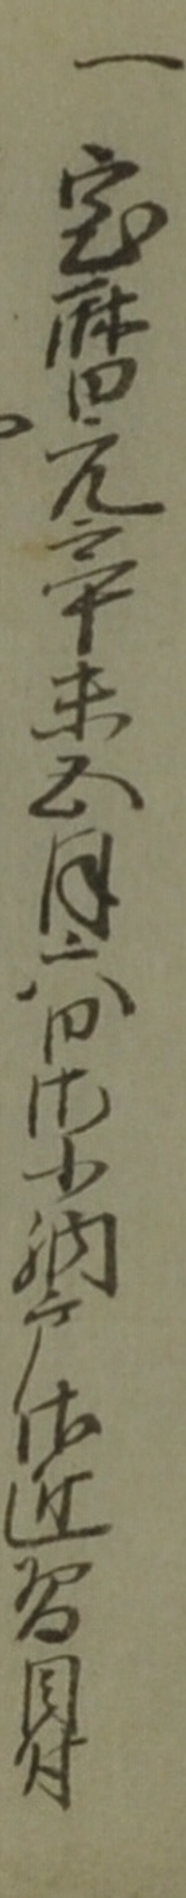一宝暦元辛未五月六日御小納戸御近習目付
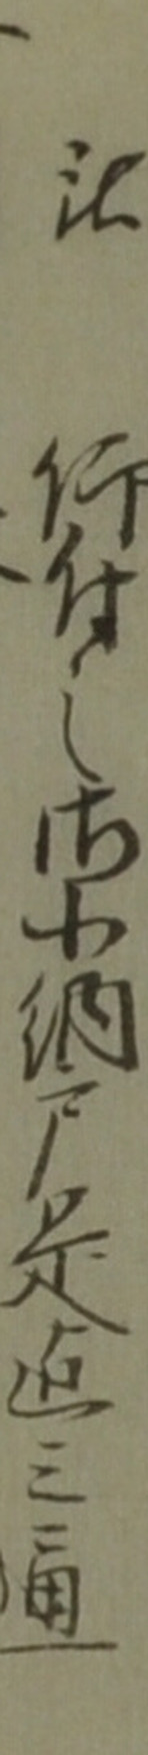被仰付之御小納戸是迄之通
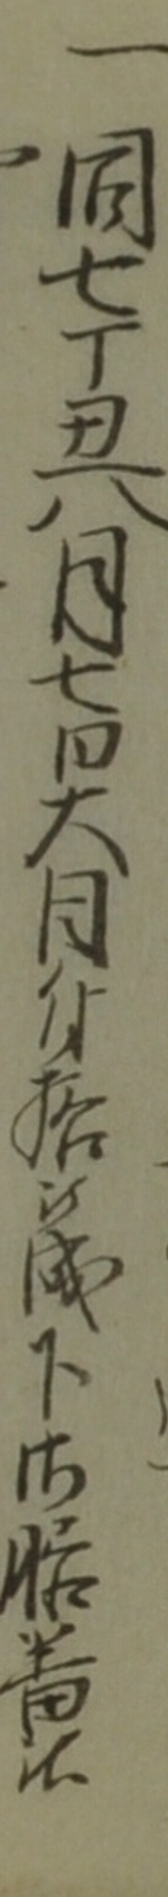一同七丁丑八月七日大目付格被成下御膳番被
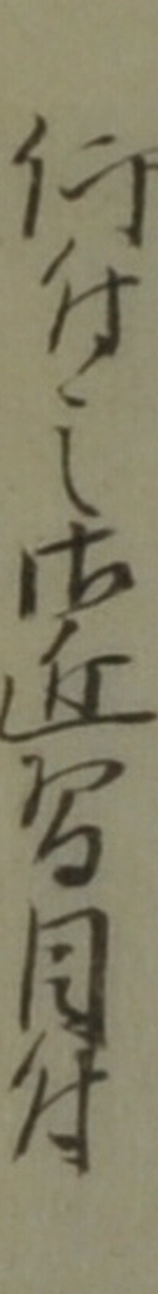仰付之御近習目付
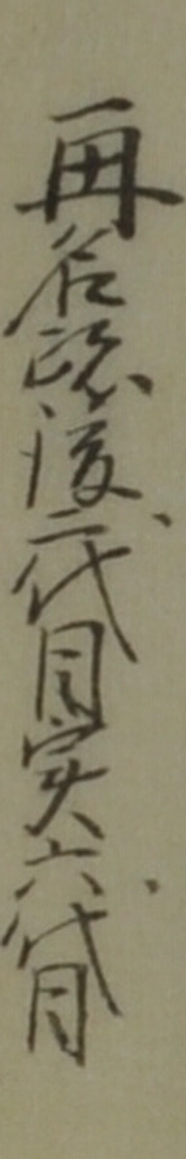再名跡後二代目実六代目
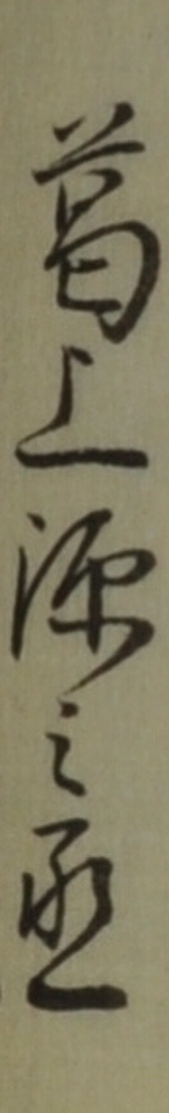葛上源之丞
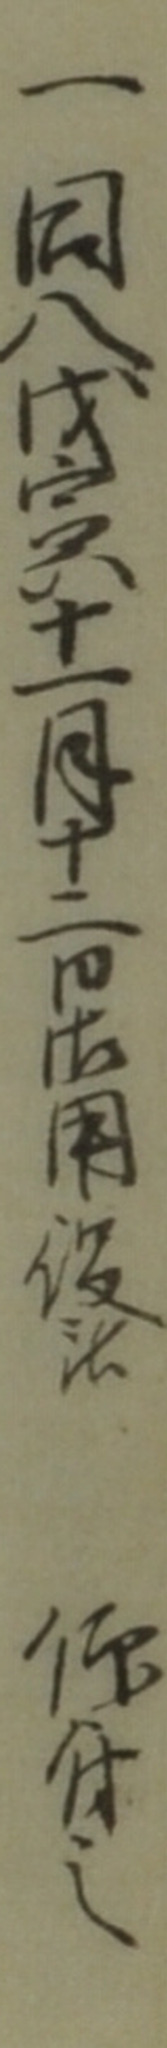一同八戊寅十一月十二日御用役被仰付之
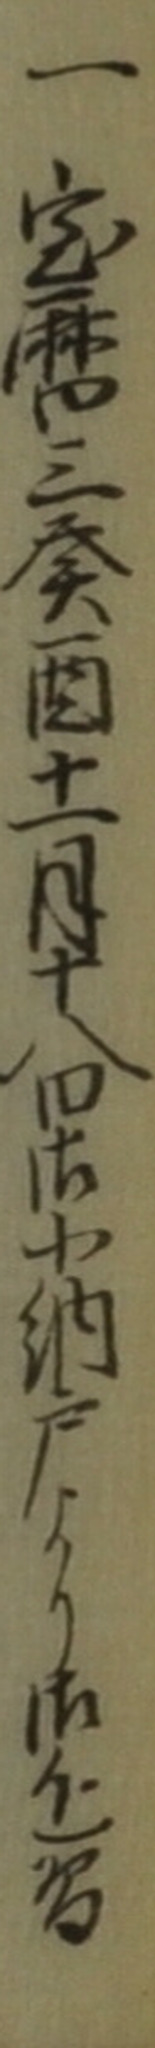一宝暦三癸酉十一月十八日御小納戸より御近習
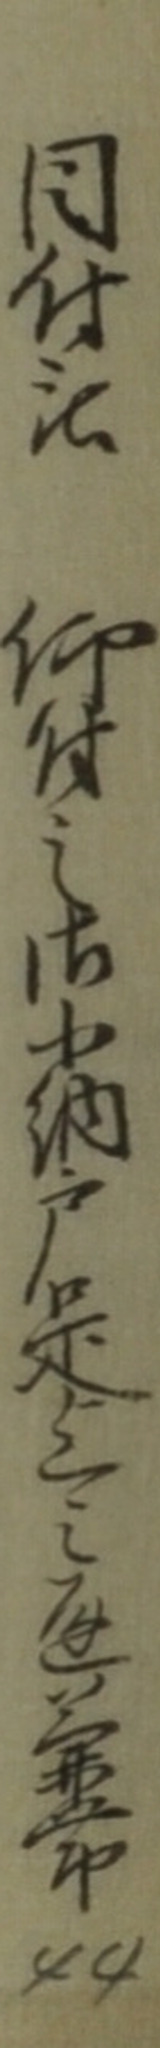目付被仰付之御小納戸是迄之通兼帯
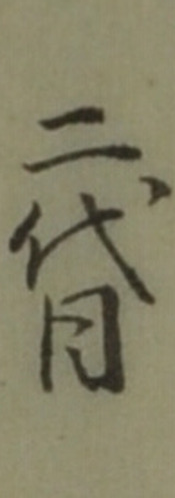二代目
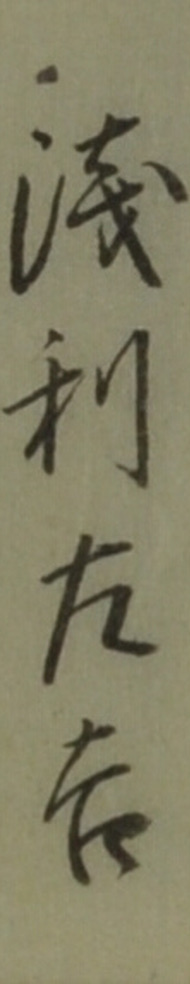浅利左吉
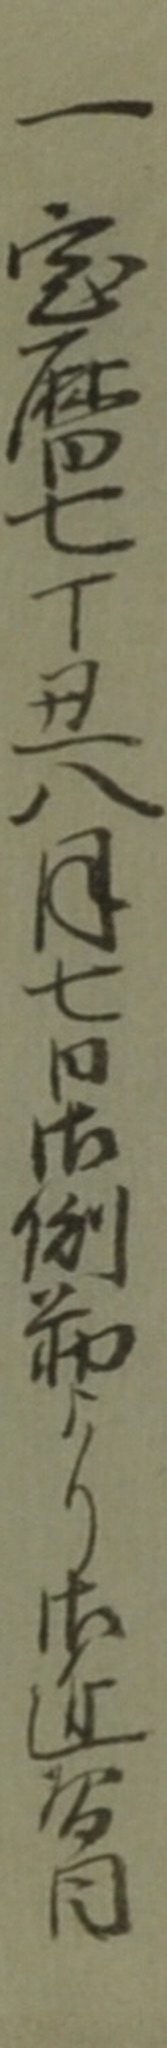一宝暦七丁丑七日御側勤より御近習目
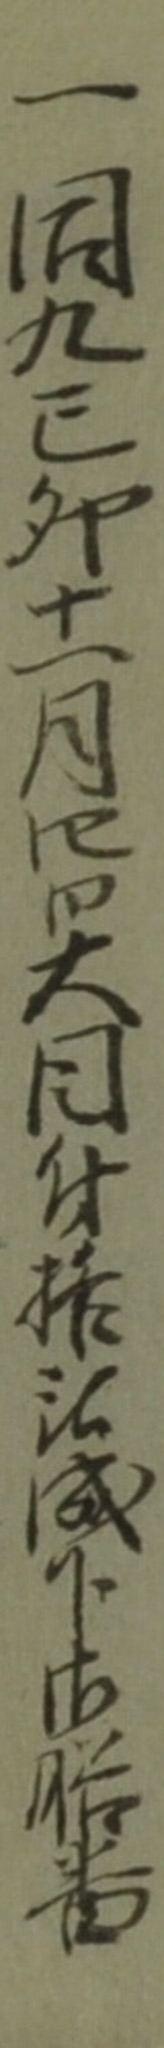一同九己卯十一月四日大目付格被成下御膳番
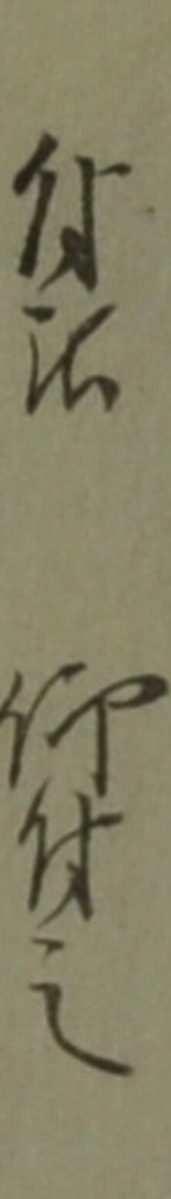付被仰付之
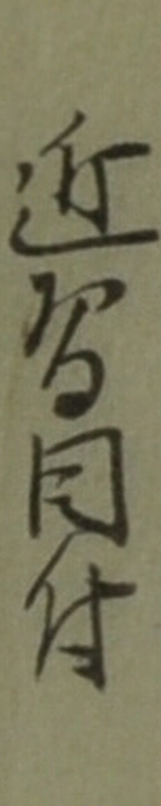近習目付
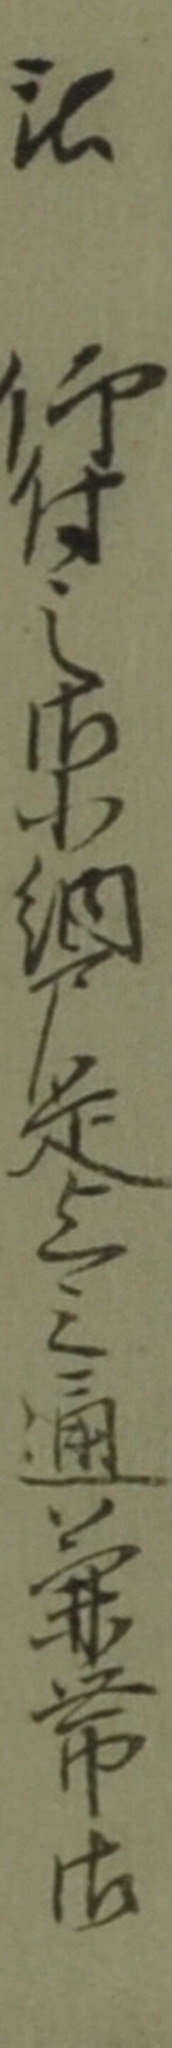被仰出之御小納戸是迄之通兼帯御
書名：諸御役代々録（四）
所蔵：伊那市立高遠町図書館・合同会社AMANE
